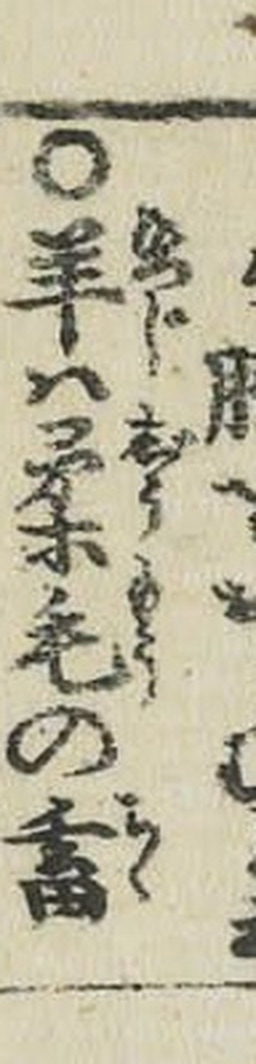○羊は柔毛の畜
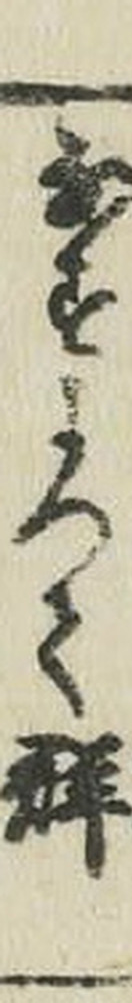なすよつて群
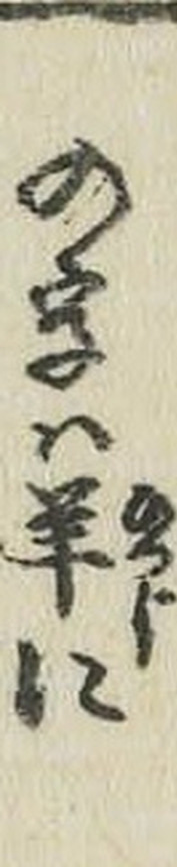の字は羊に
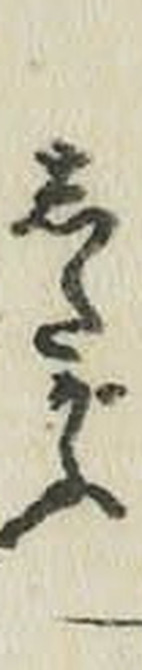したがふ
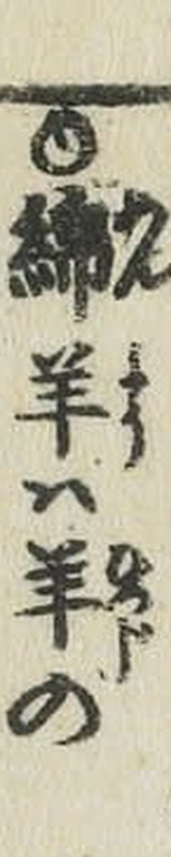○綿羊は羊の
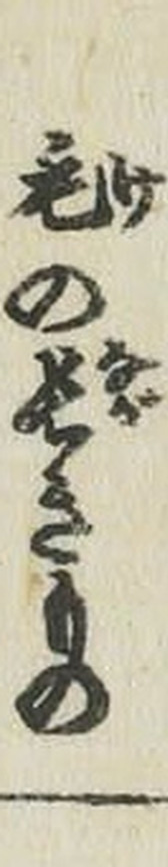毛の長きもの
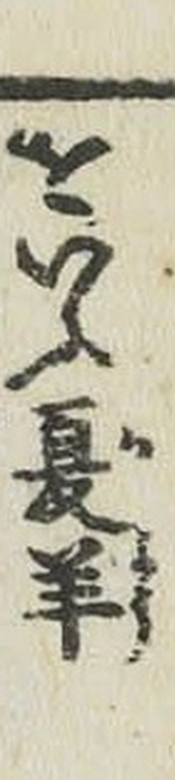をいふ夏羊
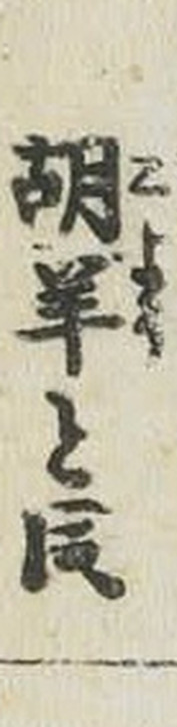胡羊と同
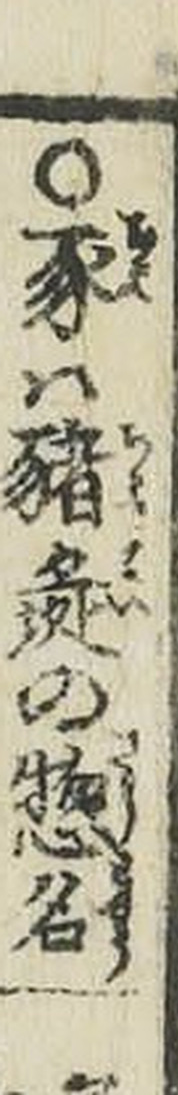○豕は豬彘の惣名
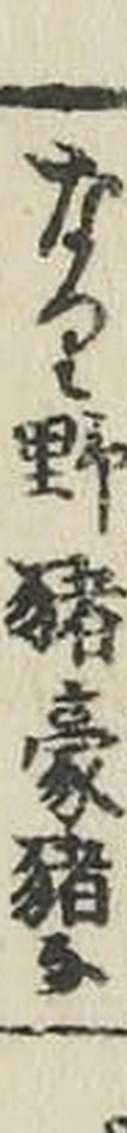なり野豬豪豬な
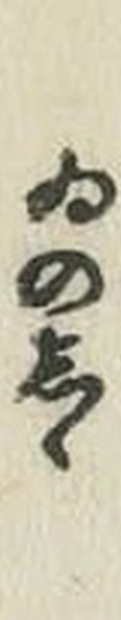ゐのしゝ
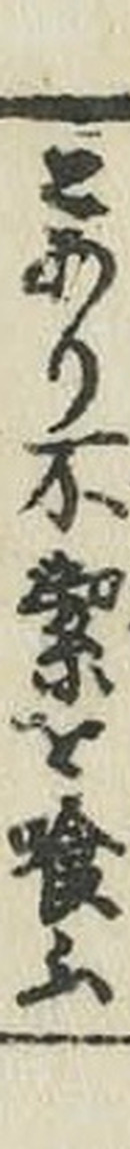とあり不絜を喰ふ
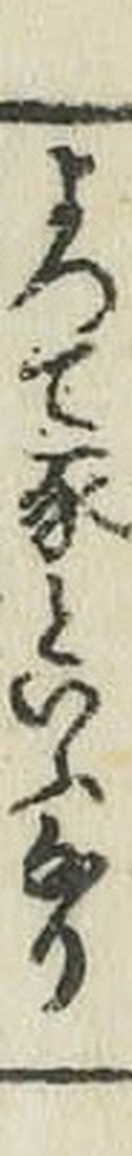よつて豕といふなり
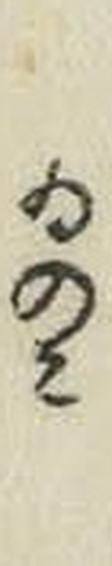ゐのこ
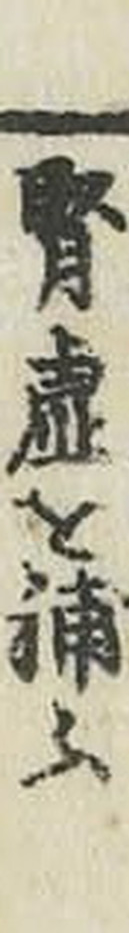腎虚を補ふ
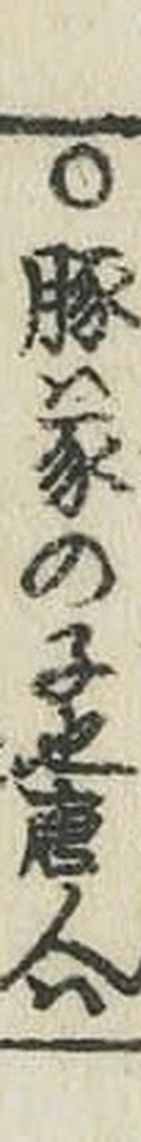○豚は豕の子也唐人は
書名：増補頭書訓蒙図彙大成 10巻 6:巻之12-13
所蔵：東京学芸大学教育コンテンツアーカイブ
